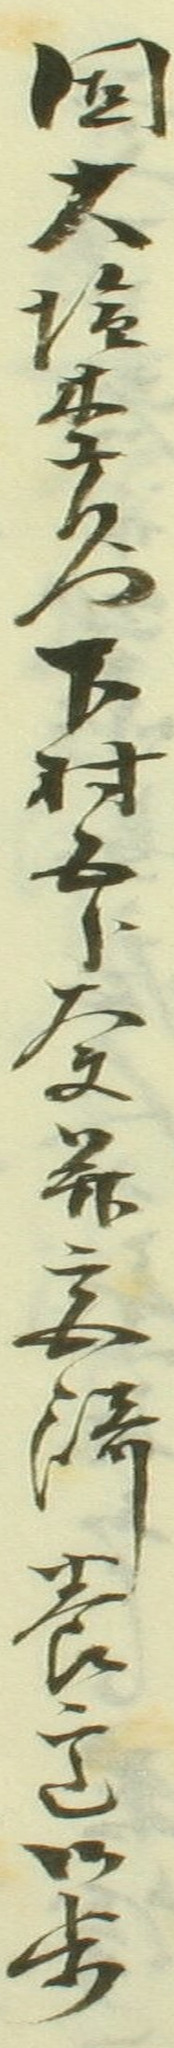固大塩杢左衛門下村五郎大夫并宮崎養意御歩
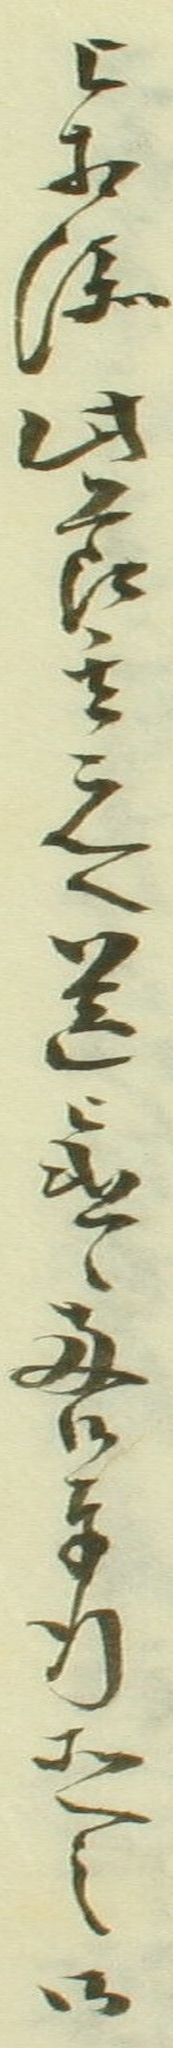被相添此節其元へ送被遣候両御奉行所へ之御
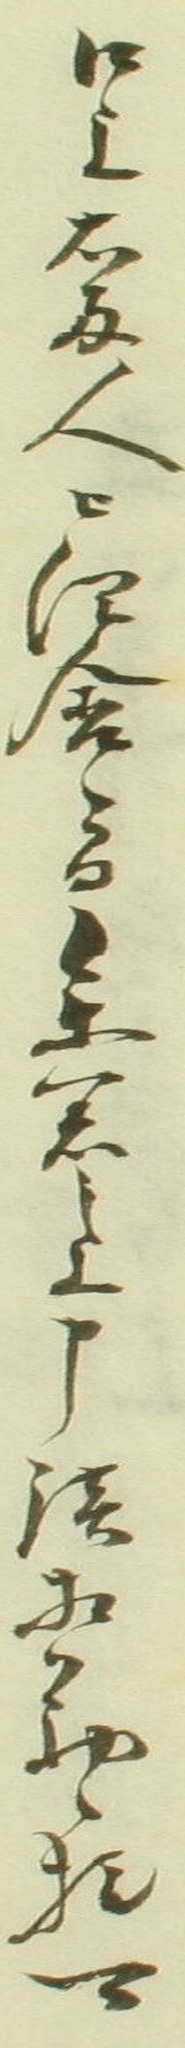口上右両人被任会候間参着之上申談相勤候様可
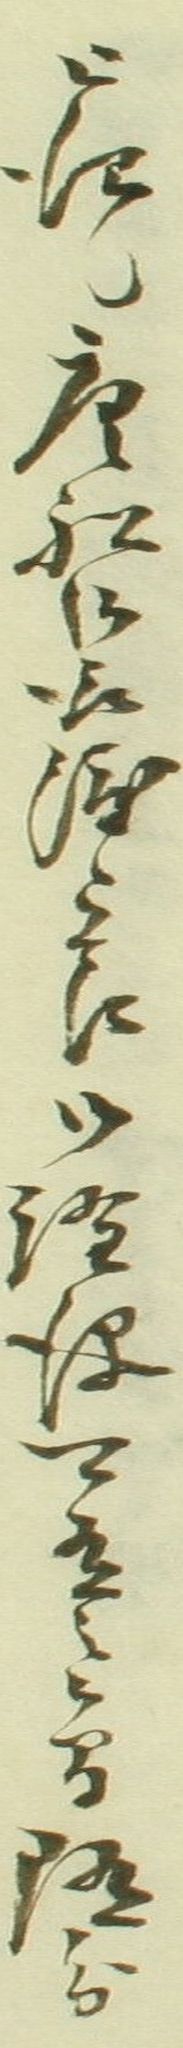被任候唐船御取渡候節御詮議可有之候間随分
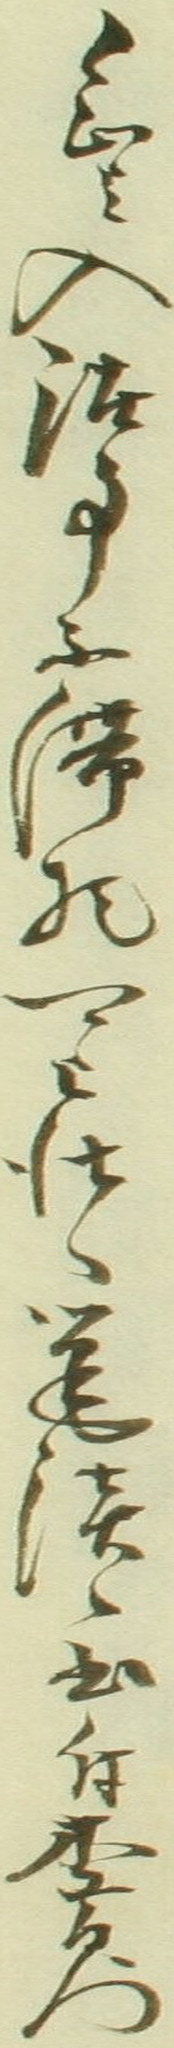念者入候事不滞様可被仕候筆談候書付杢左衛門
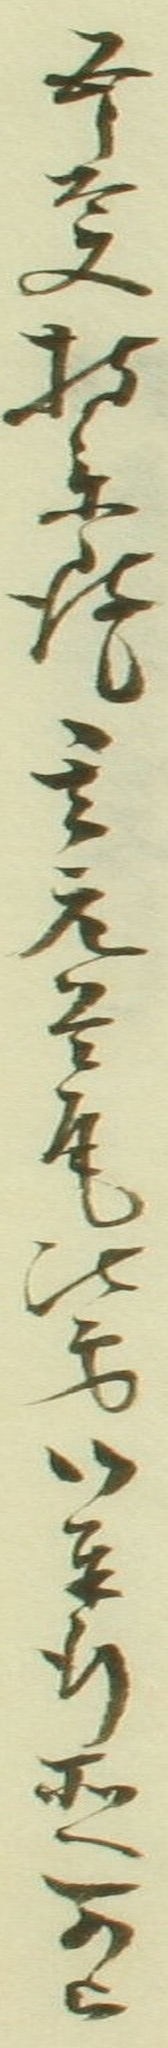五郎大夫持参致候其元首尾次第御奉行所へ可被
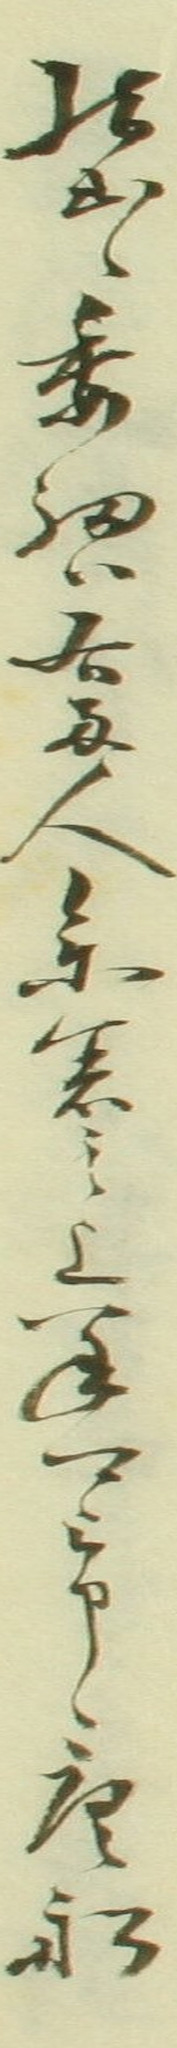指出候委細ハ右両人参着之上承可被申候唐船
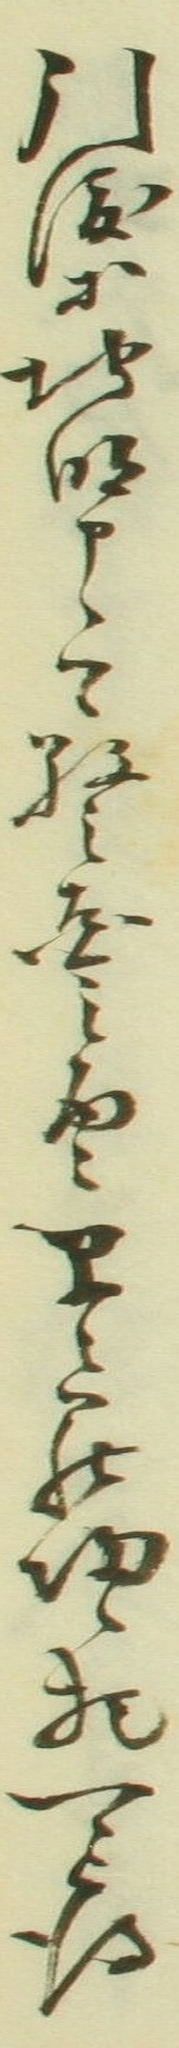引渡等埒明申候ハヽ警固之面々早々罷帰候様可被得

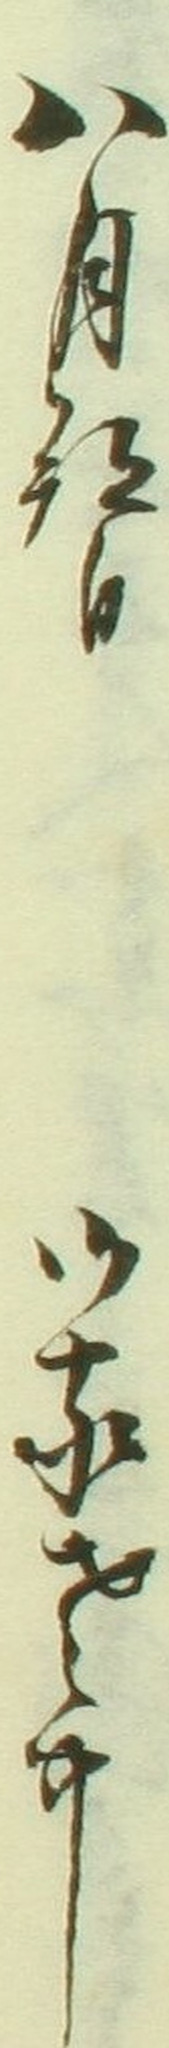八月朔日御家老中
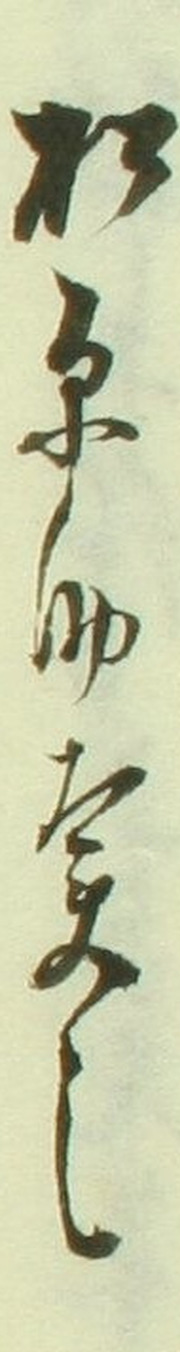松原助大夫殿
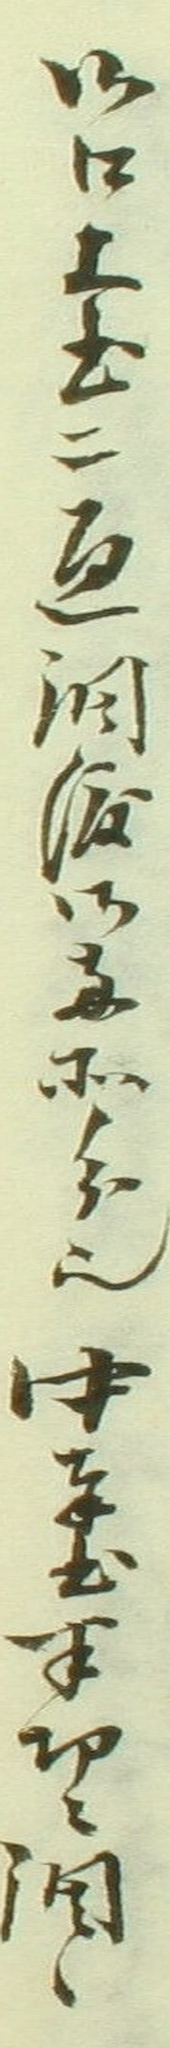御口上書二通調渡御両所分也中奉書半切ニ調候
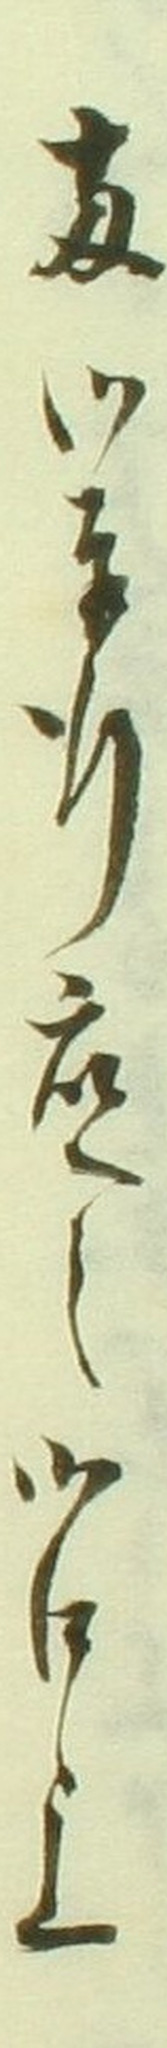両御奉行衆へ之御口上
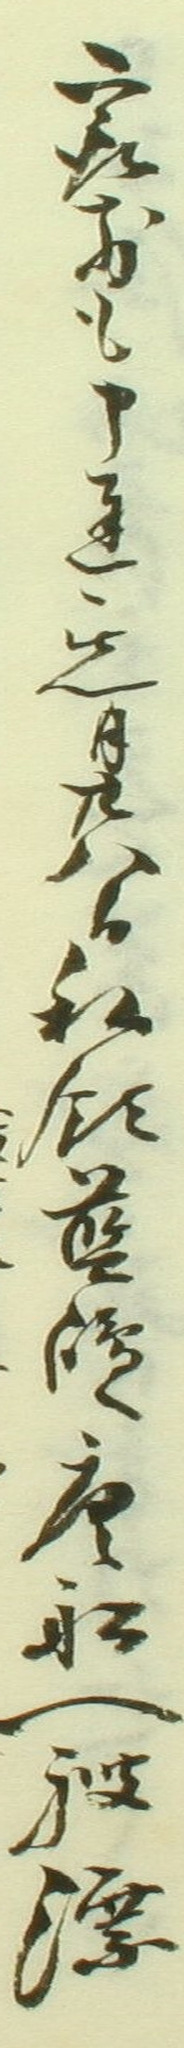最前も申達先月廿八日私領藍嶋へ唐船一艘漂
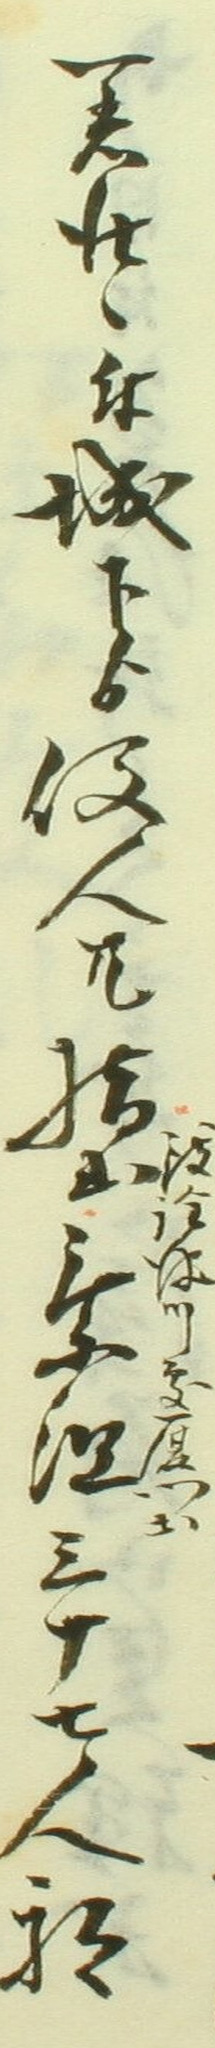着仕候付城下ゟ役人共指出乗組乗組三十七人邪
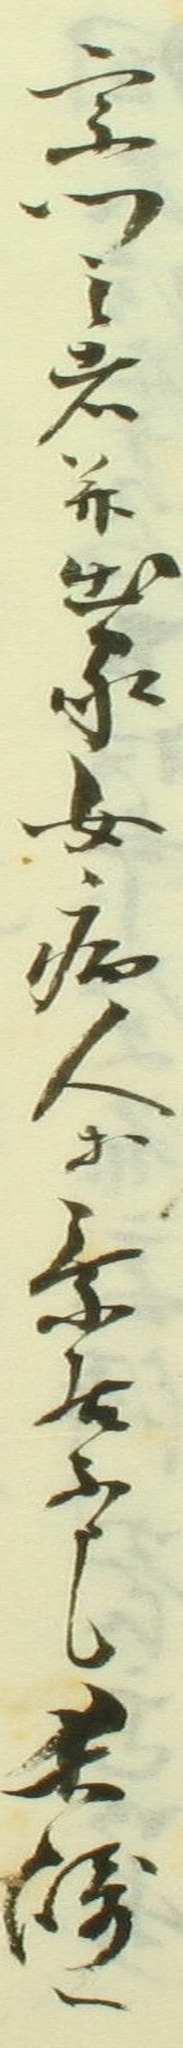宗門之者并出家女病人等乗居不申候長崎へ
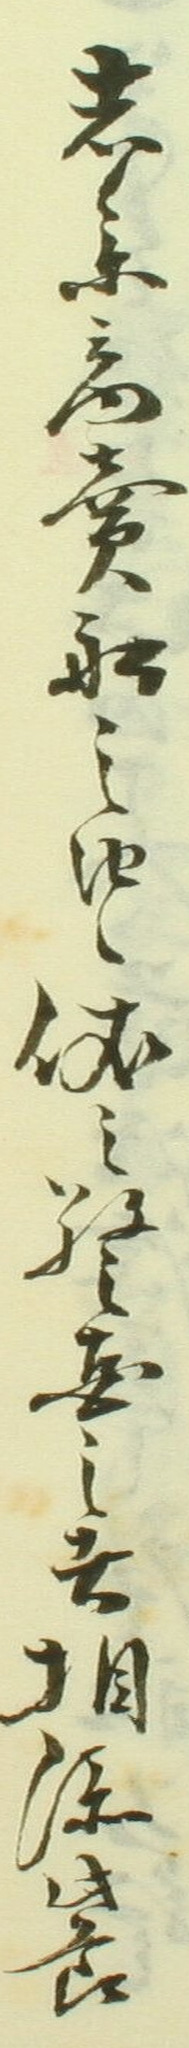者参商売船之由候依之警固之者相添此節
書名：異国船漂着記
